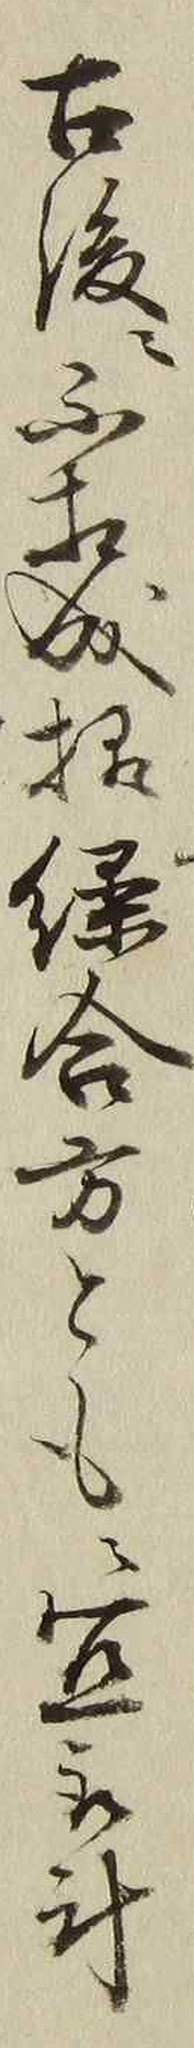古後ニ不相成様繰合方ともニ宜取計
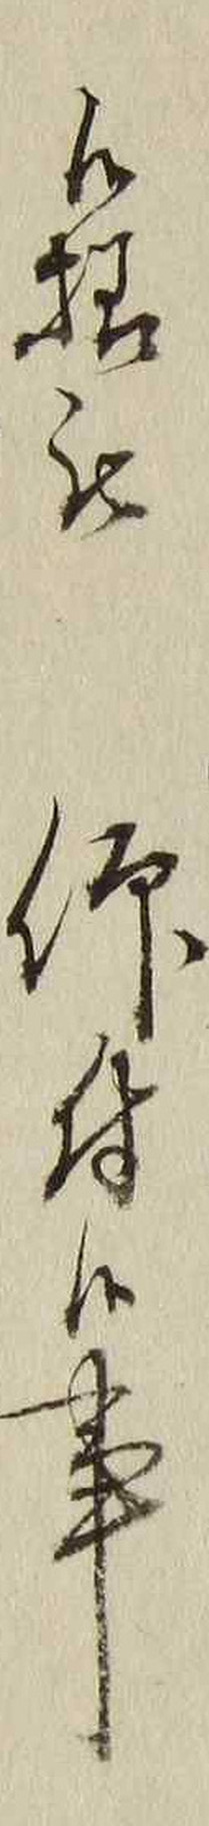候様被仰付候事
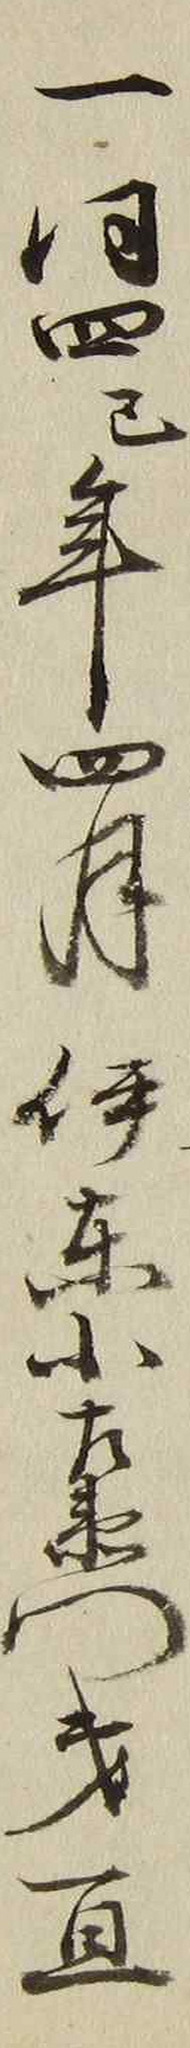一同四己年四月伊東小左衛門弟亘
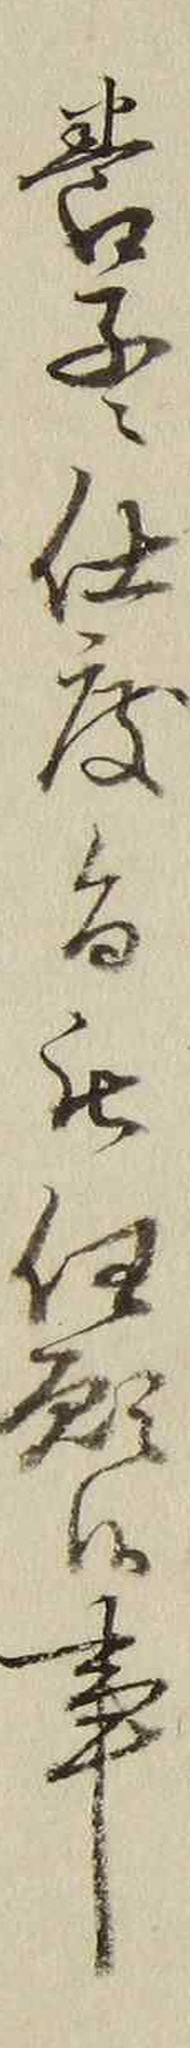養子ニ仕度旨被任願候事
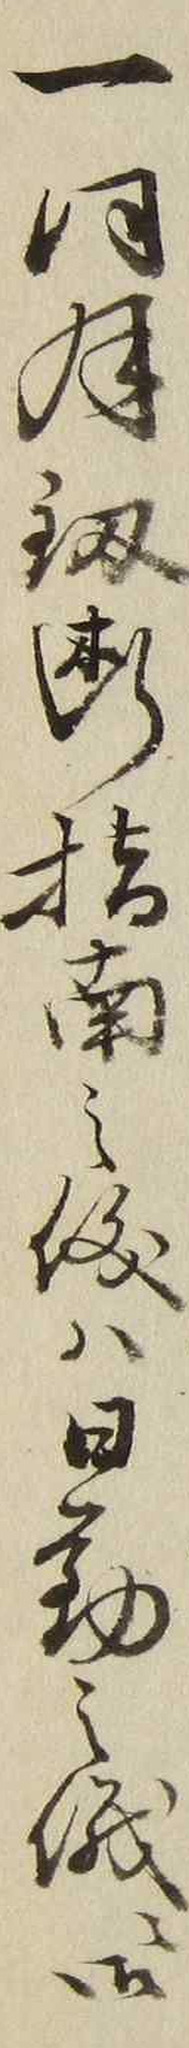一同月剣術指南之儀ハ日勤之儀ニ御

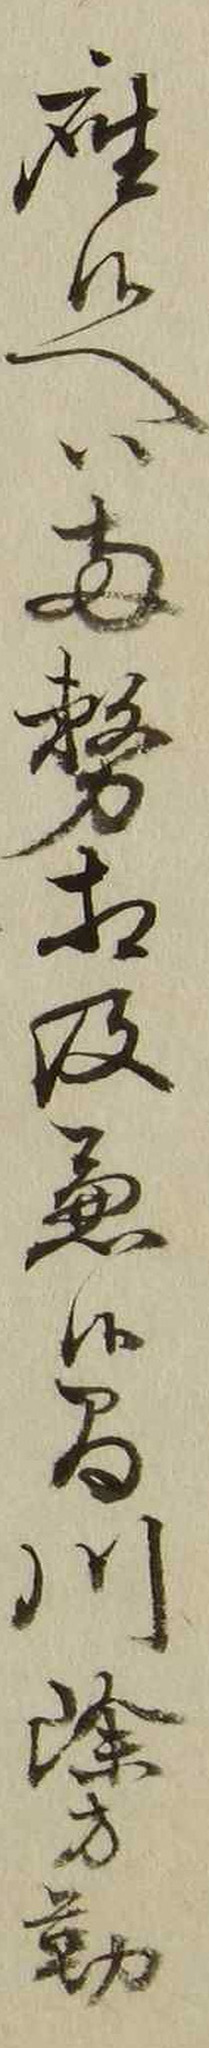座候へハ両務相及兼候間川除方勤
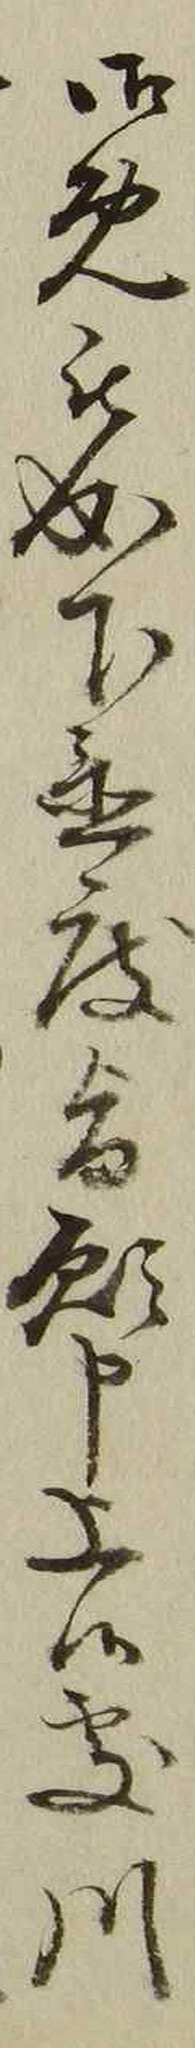御免被成下置度旨願申上候処川
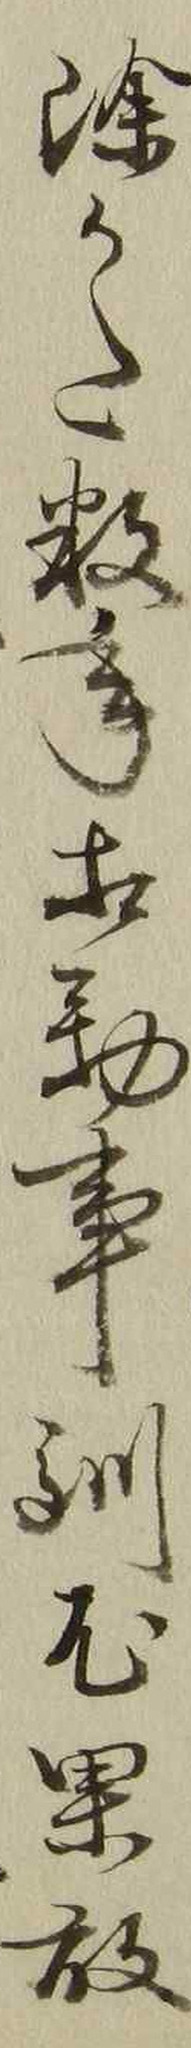除かた数年相勤事馴尤果敢
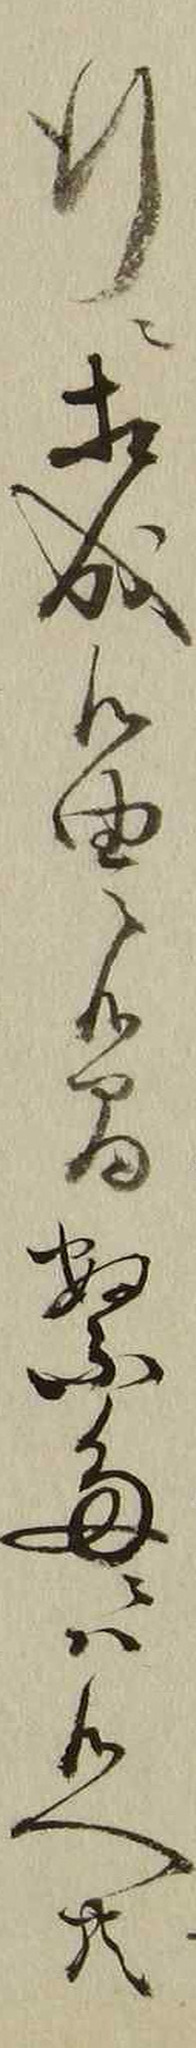行ニ相成候由ニ候間繁多ニハ候へ共
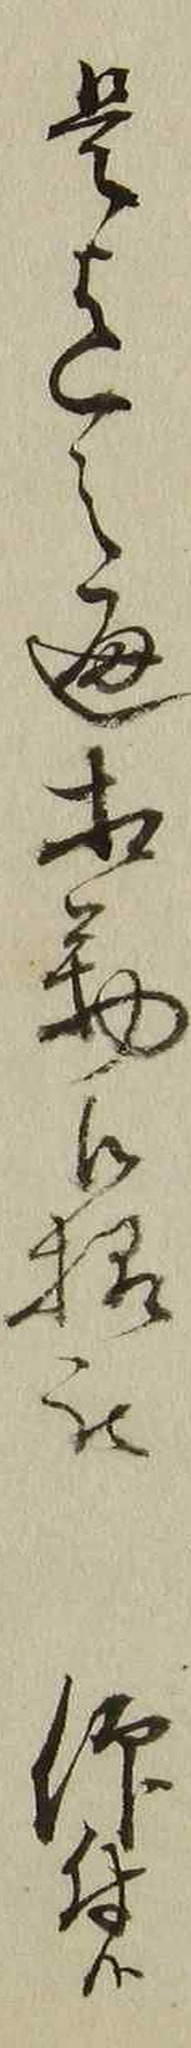是迄之通相勤候様被仰付候
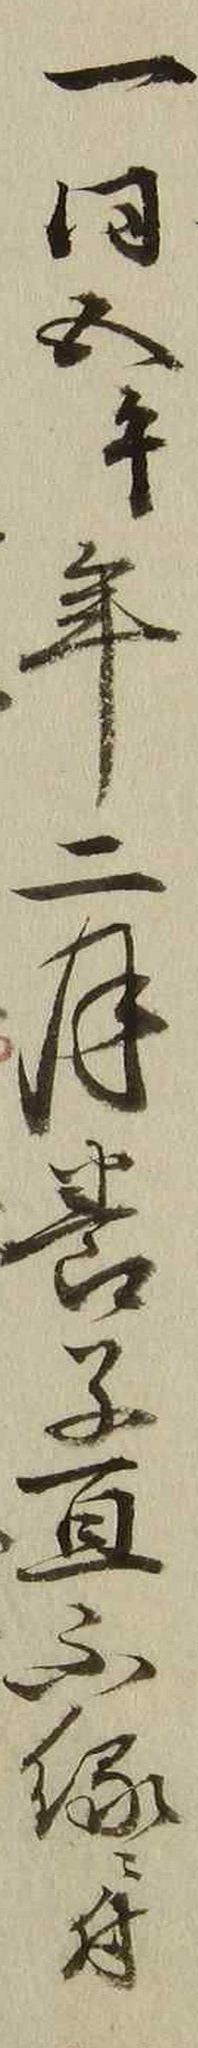一同五午年二月養子亘不縁ニ付
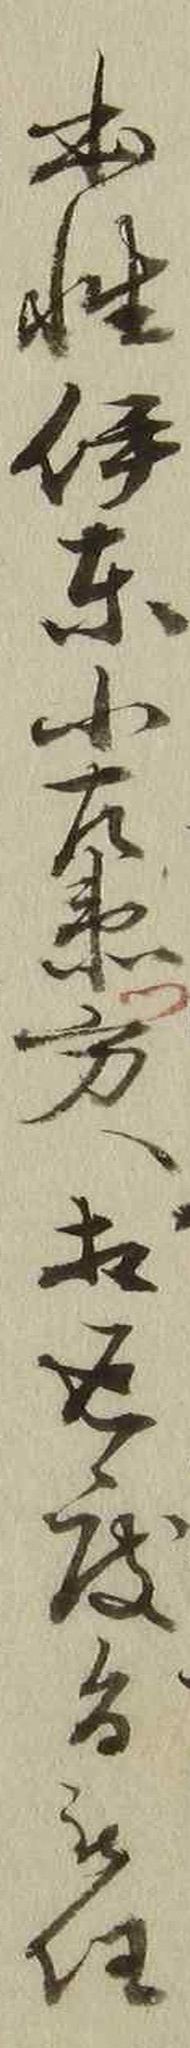本性伊東小左衛門方へ相返度旨被任
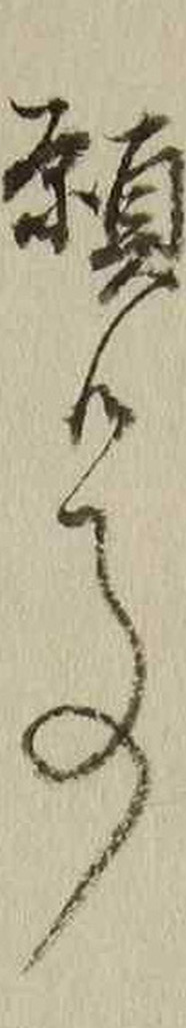願候事
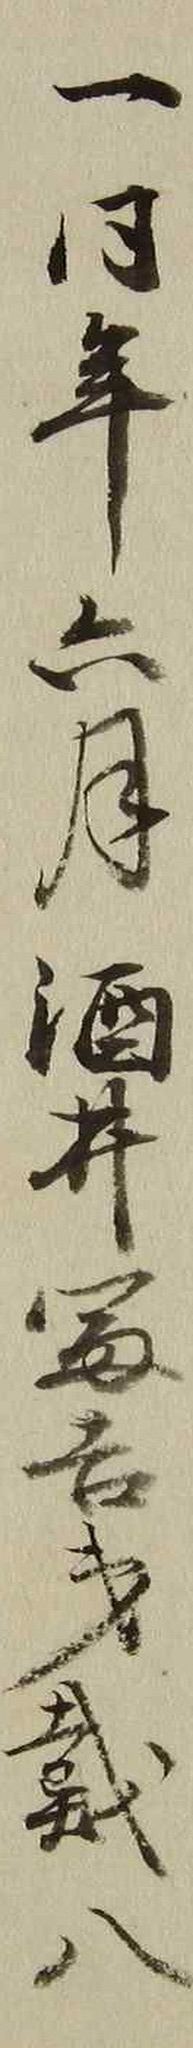一同年六月酒井富吉弟戴八
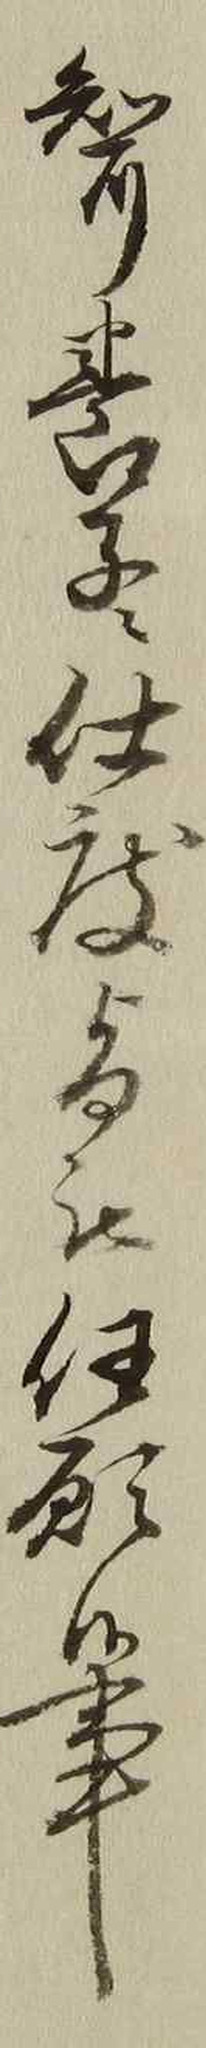婿養子ニ仕度旨被任願候事
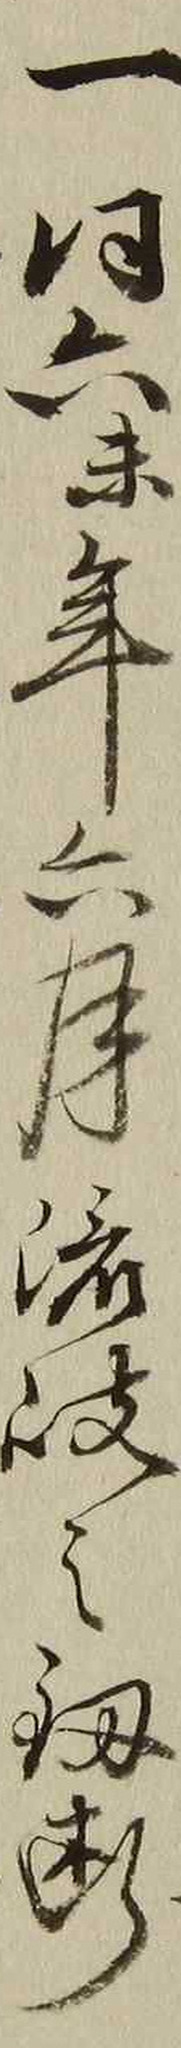一同六未年六月流岐之剣術
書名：諸士系譜　巻之36　は之部4
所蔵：会津若松市立会津図書館
